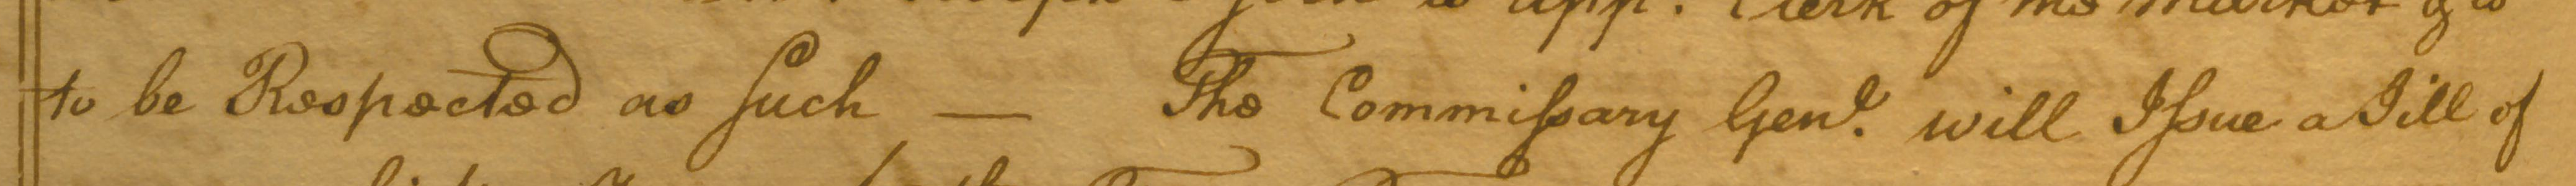to be Respected as such- The Commissary Gen^l. will Issue a Gill of
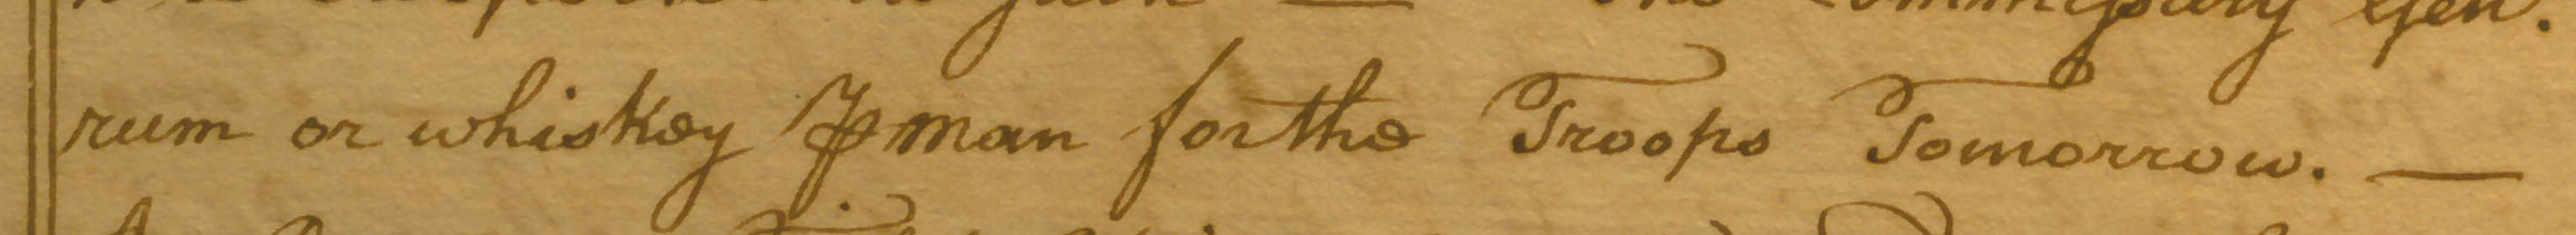rum or whiskey per man for the Troops Tomorrow.-
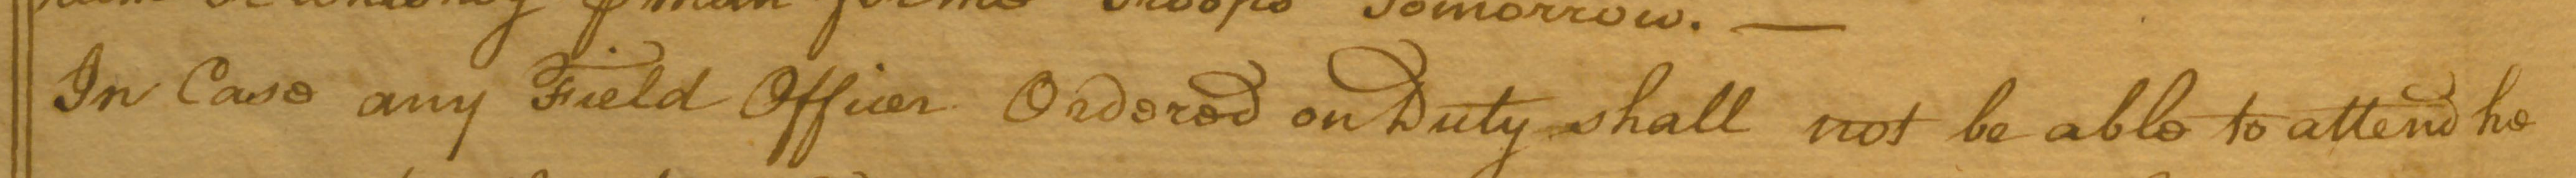In Case any Field Officer ordered on Duty shall not be able to attend he
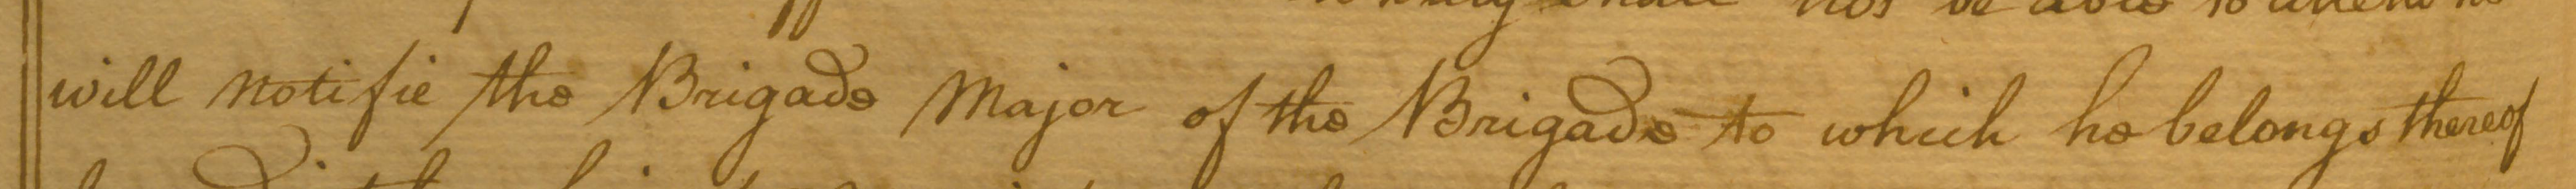will notifie the Brigade Major of the Brigade to which he belongs thereof
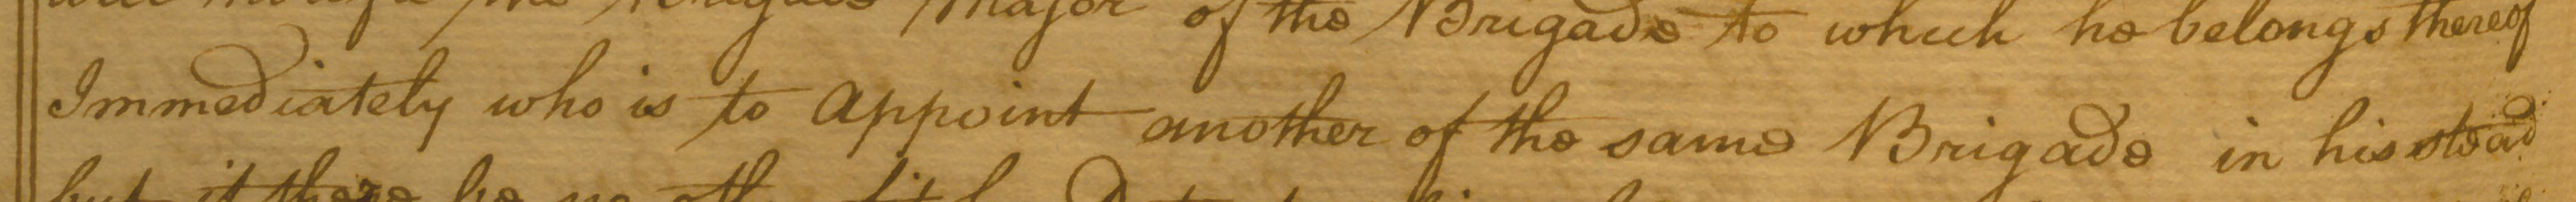Immediately who is to appoint another of the same Brigade in his stead
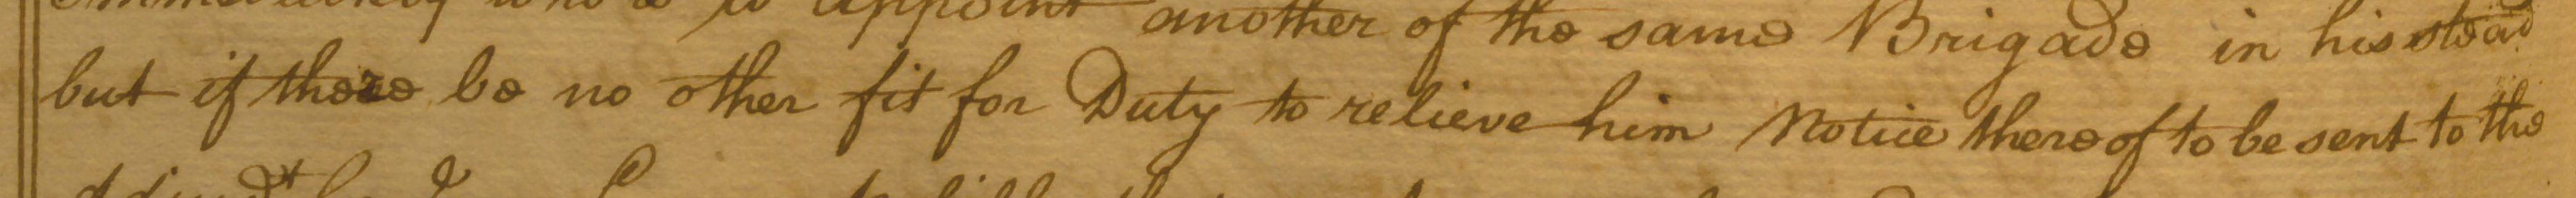but if there be no other fit for Duty to relieve him notice thereof to be sent to the
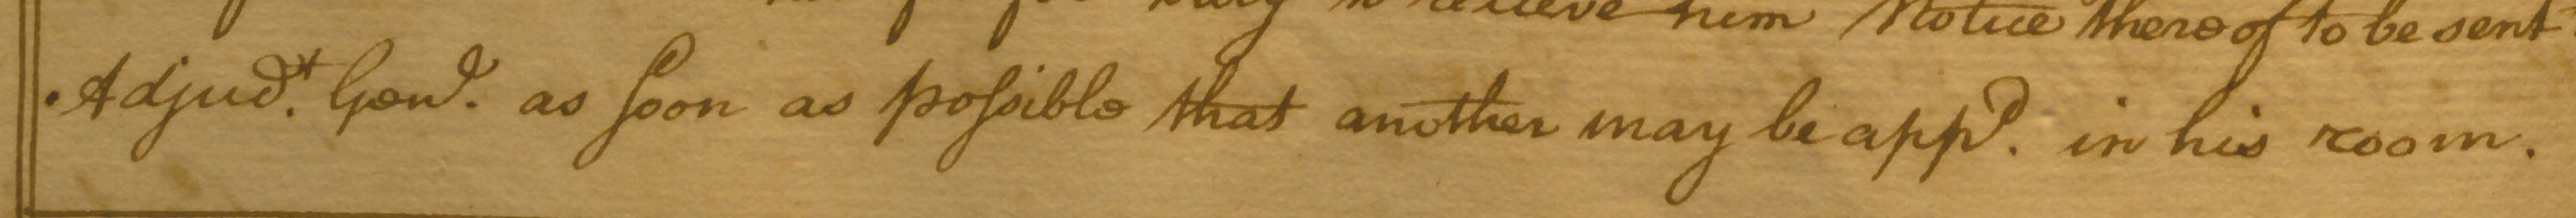Adjud^t. Gen^l. as soon as possible that another may be app^d. in his room.
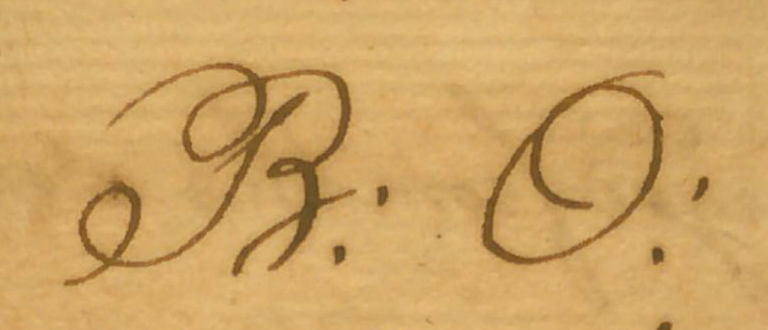B: O:
